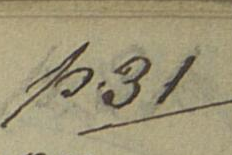p 31
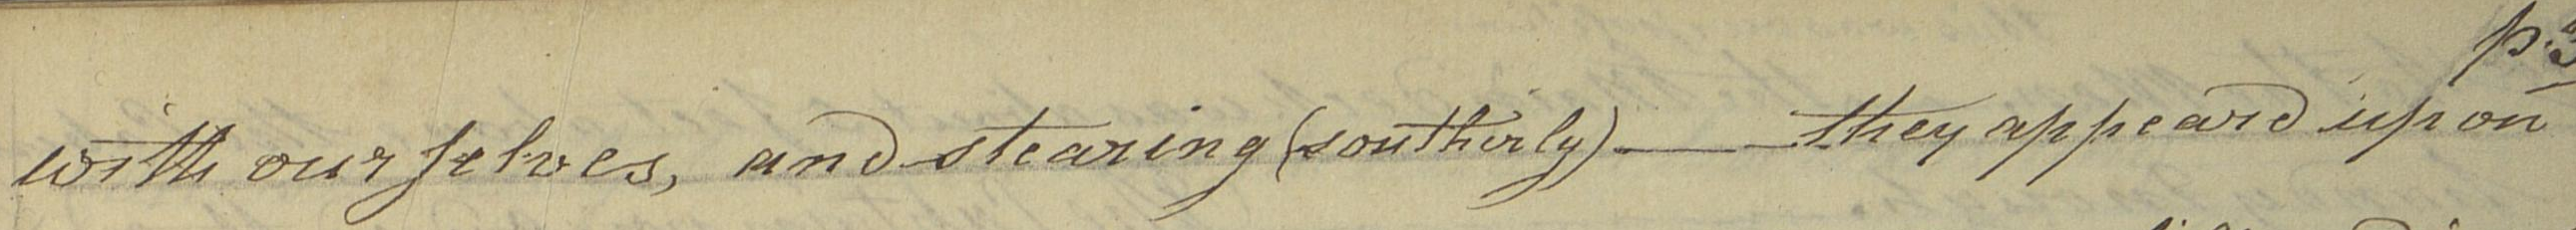with ourselves, and stearing (southerly) They appeard upon
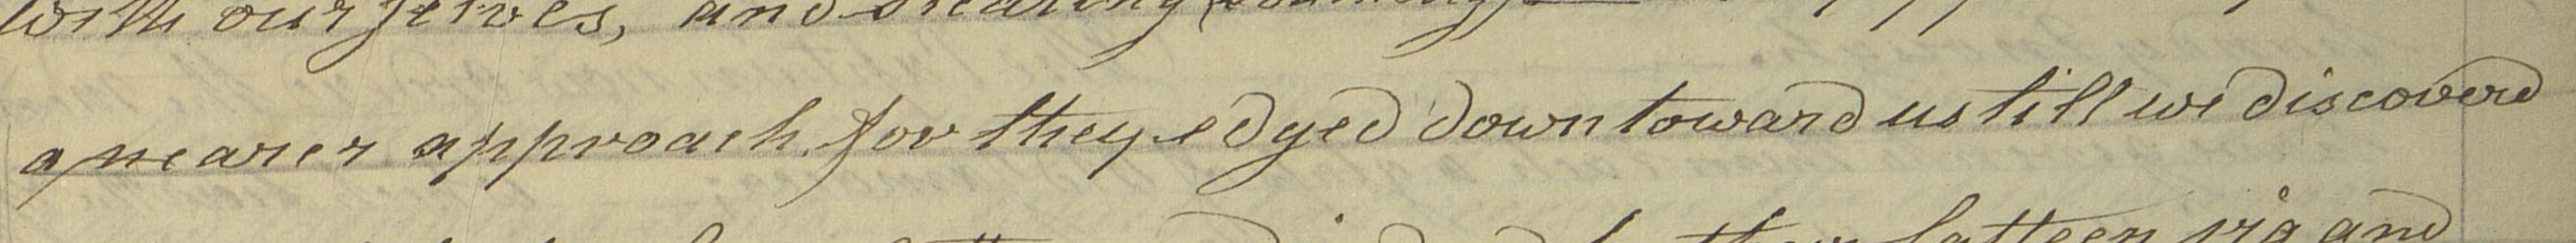a nearer approach for they edged down toward us till we discoverd
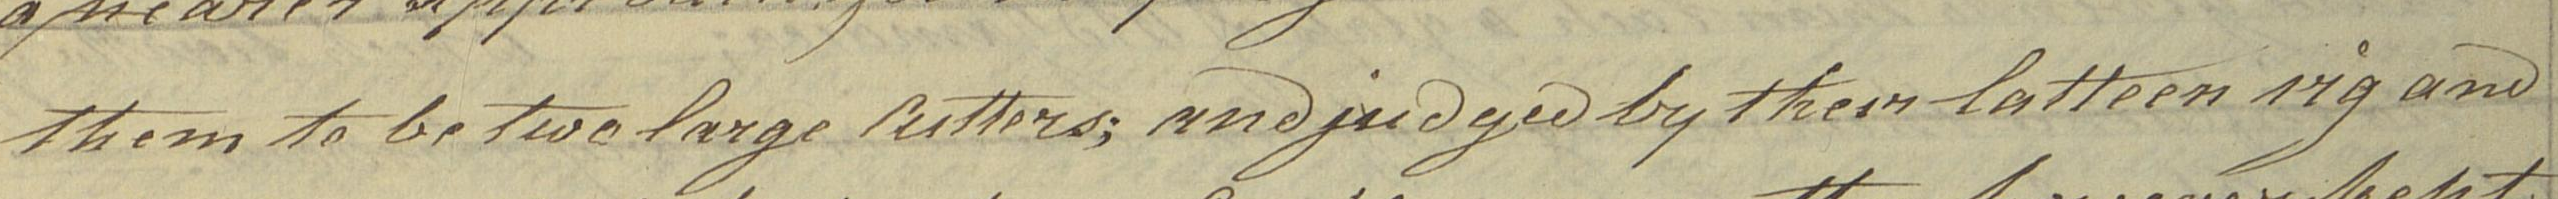them to be two large cutters, and judged by their latteen rig and
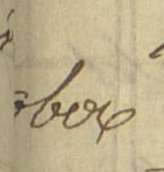-ber
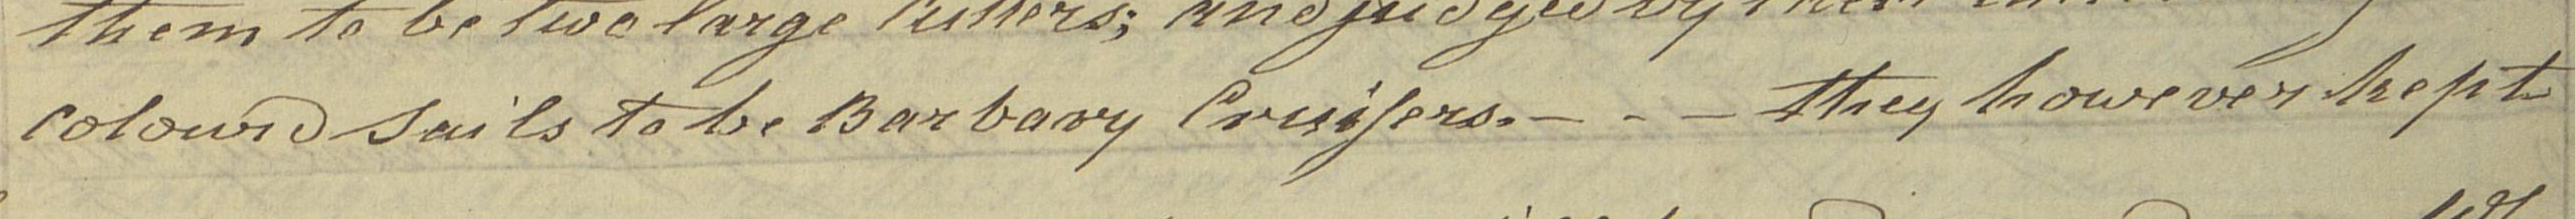colourd Sails to be Barbary Cruisers. they however kept
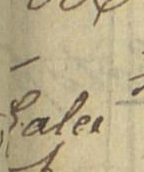-alea
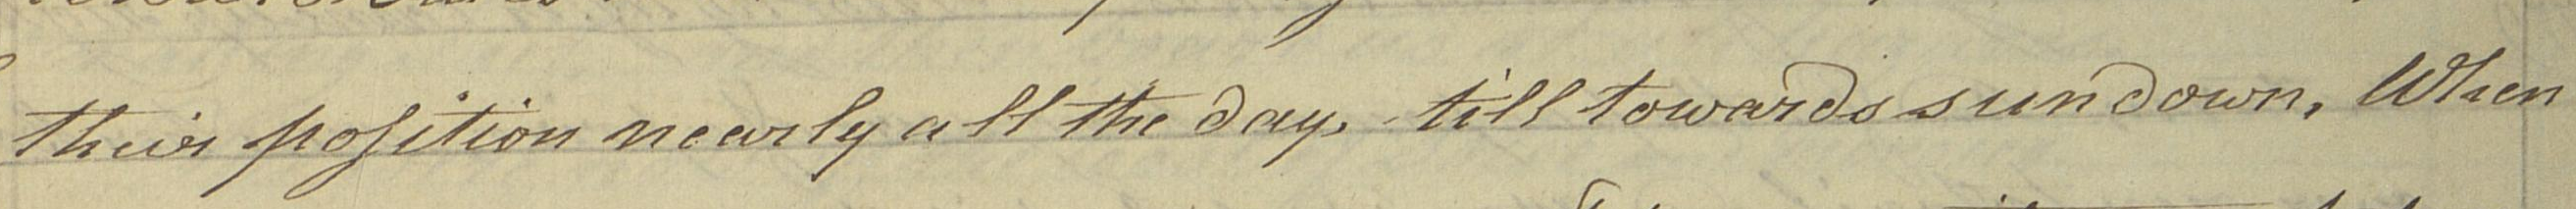their position nearly all the day, till towards sundown, When
